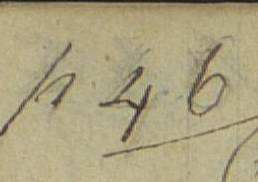p 46
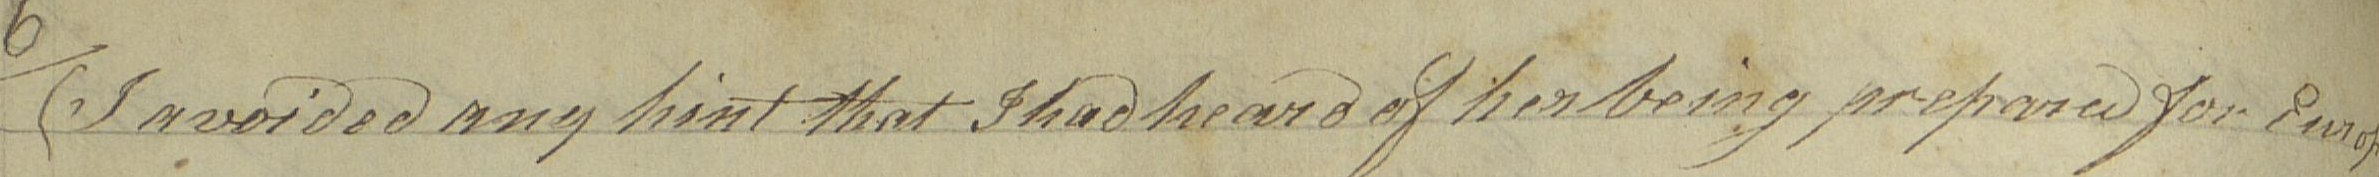(I avoided any hint that I had heard of her being prepared for Europe
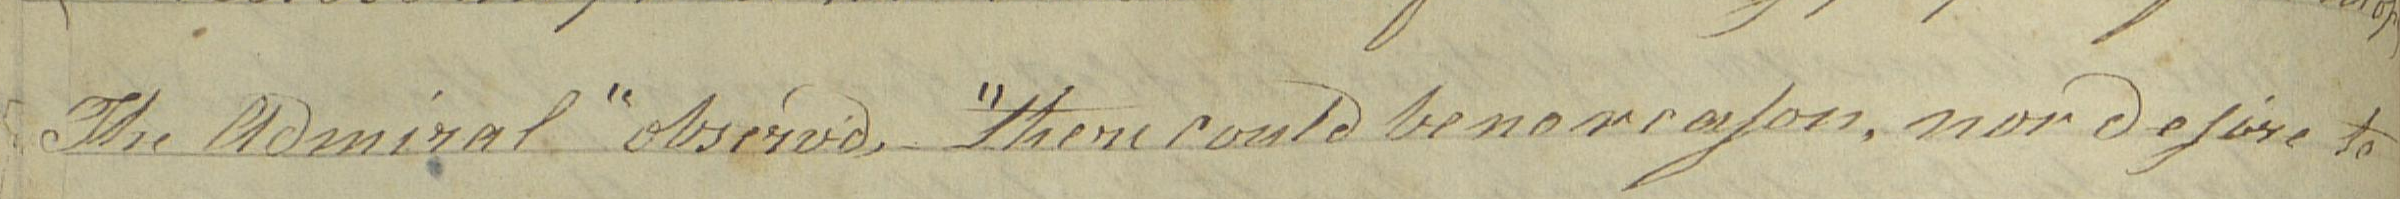The Admiral "observ'd, "there could be no reason, nor desire to
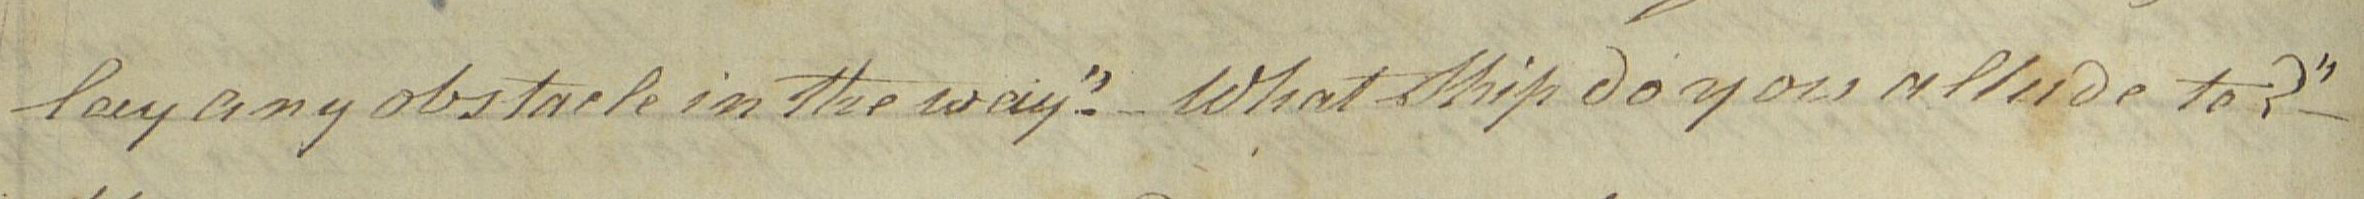lay any obstacle in the way." What Ship do you allude to?"
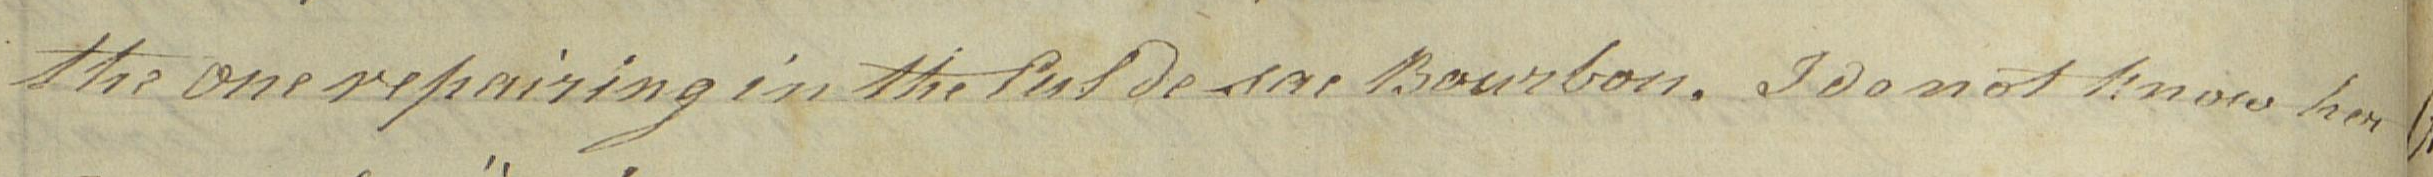the one repairing in the Cul de Sac Bourbon. I do not know her
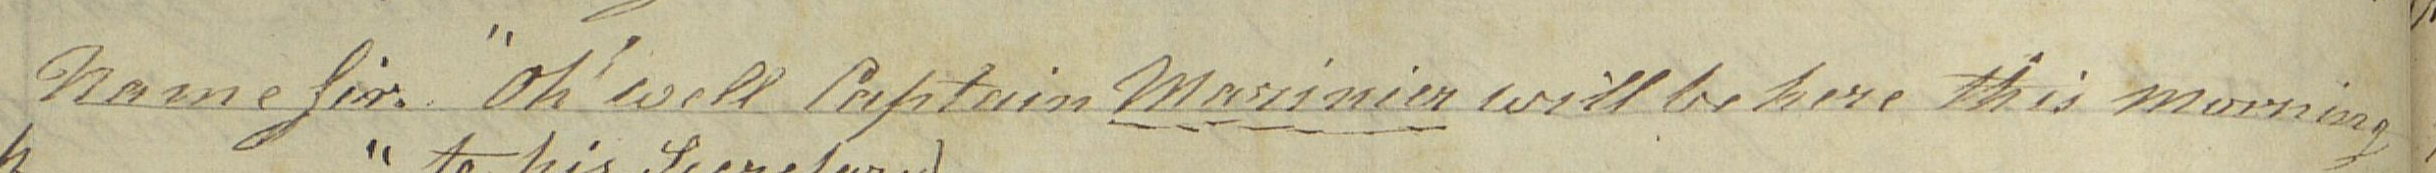name sir. "Oh well Captain Marinier will be here this morning
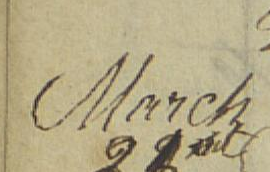March
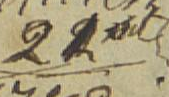21^st
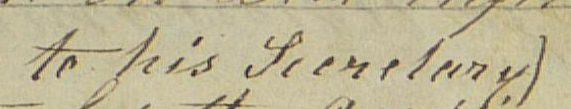to his Secretary)
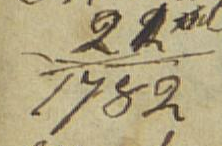1782
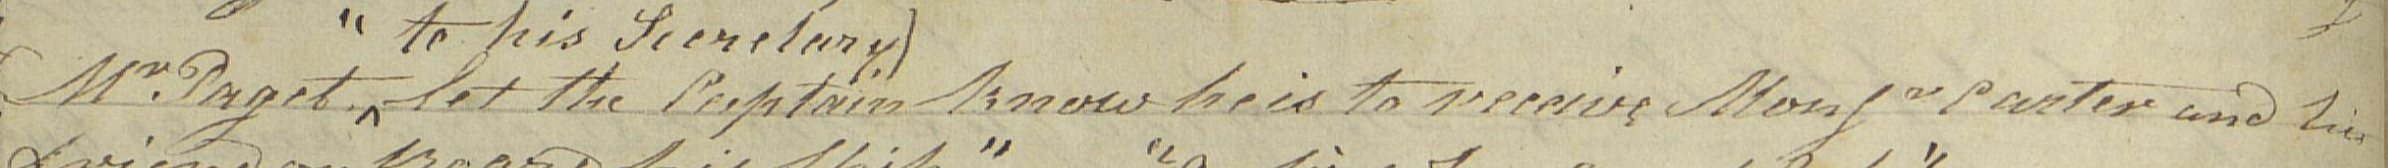M^r. Paget ^ let the Captain know he is to receive Mons^r Carter and his
